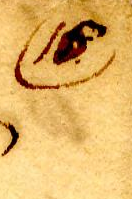10
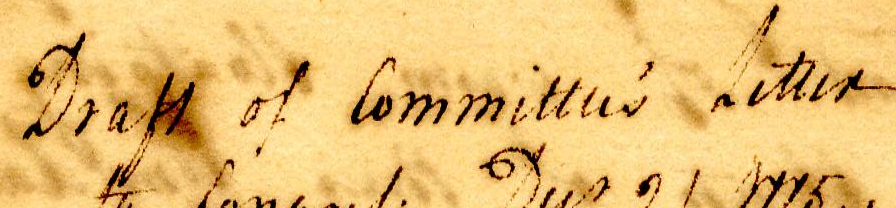Draft of Committee's Letter
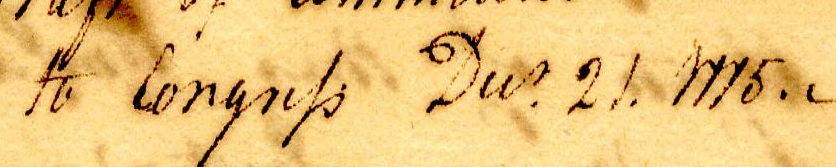to Congress Dec^r. 21. 1775.
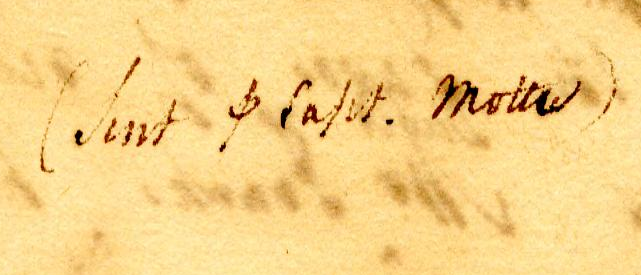(Sent Per Capt. Motts)
